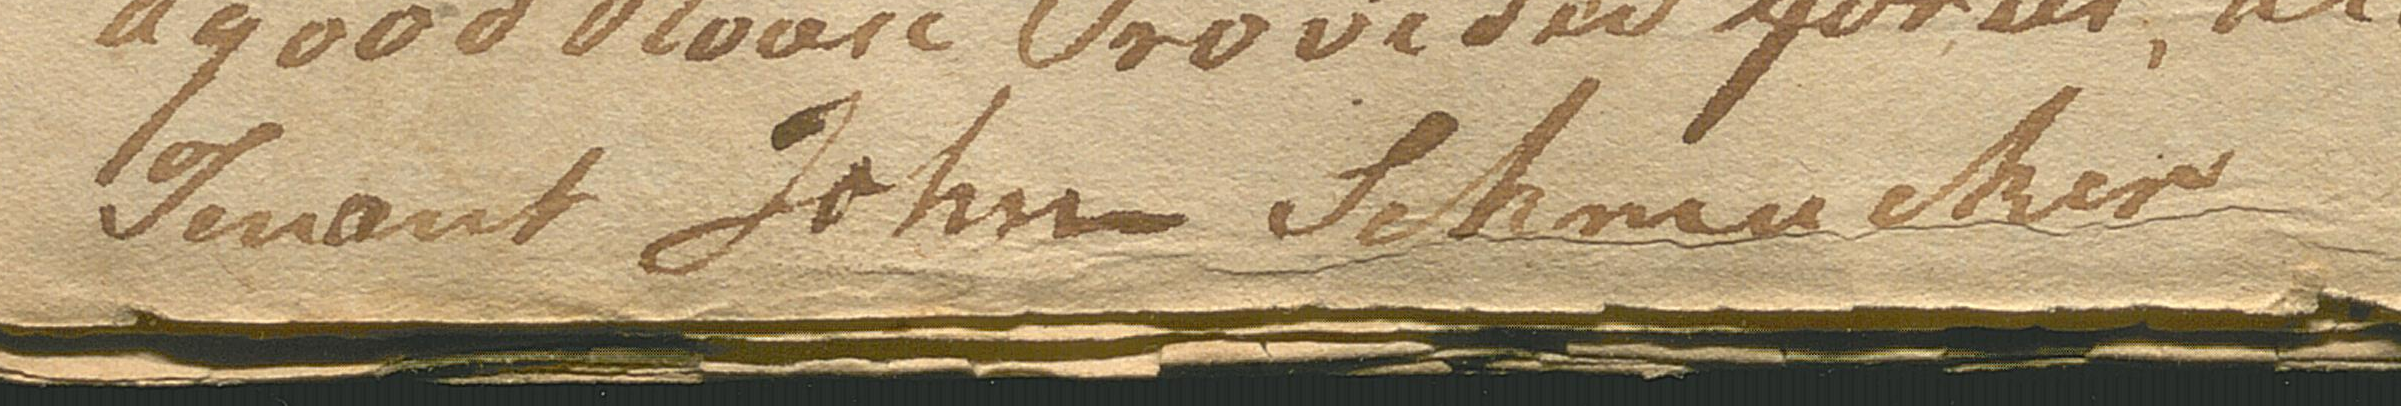Tenant John Schmucker
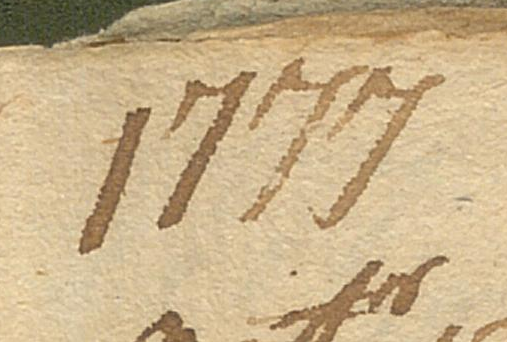1777
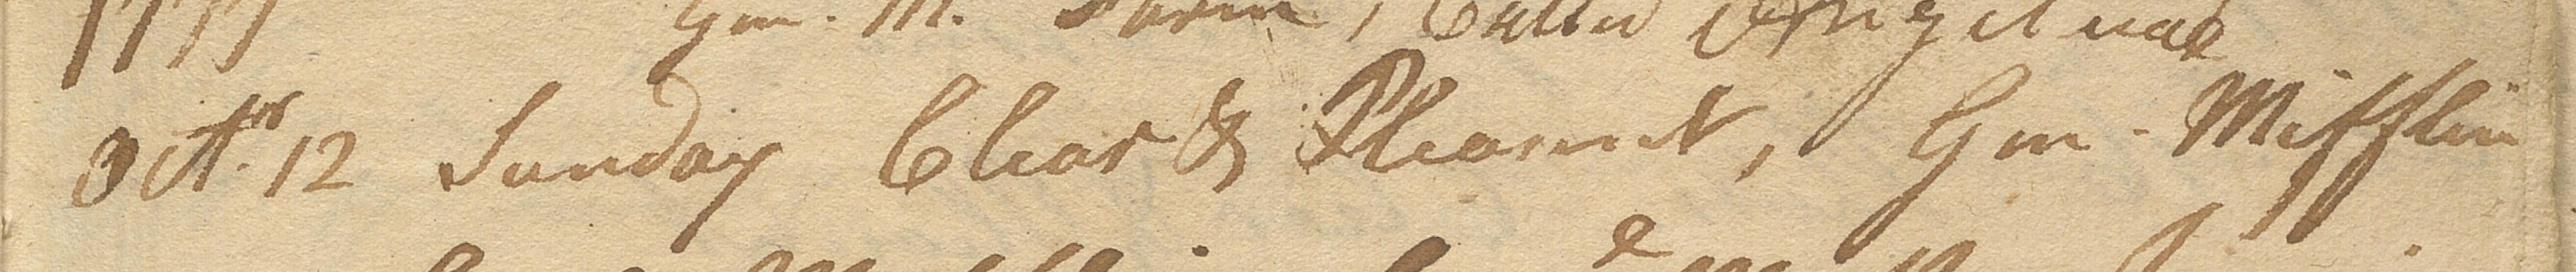Oct^r. 12 Sunday Clear & Pleasent, & Gen^l. Mifflin
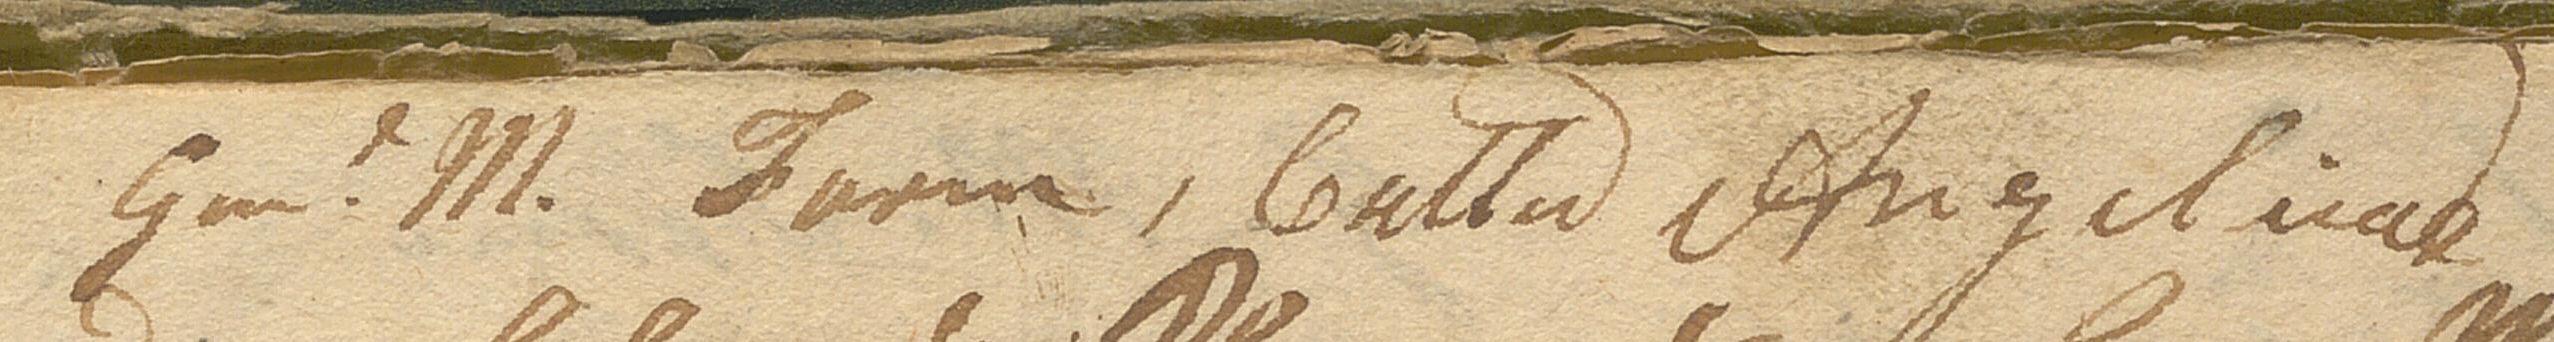Gen^l. M. Farm, Catted Angelicae
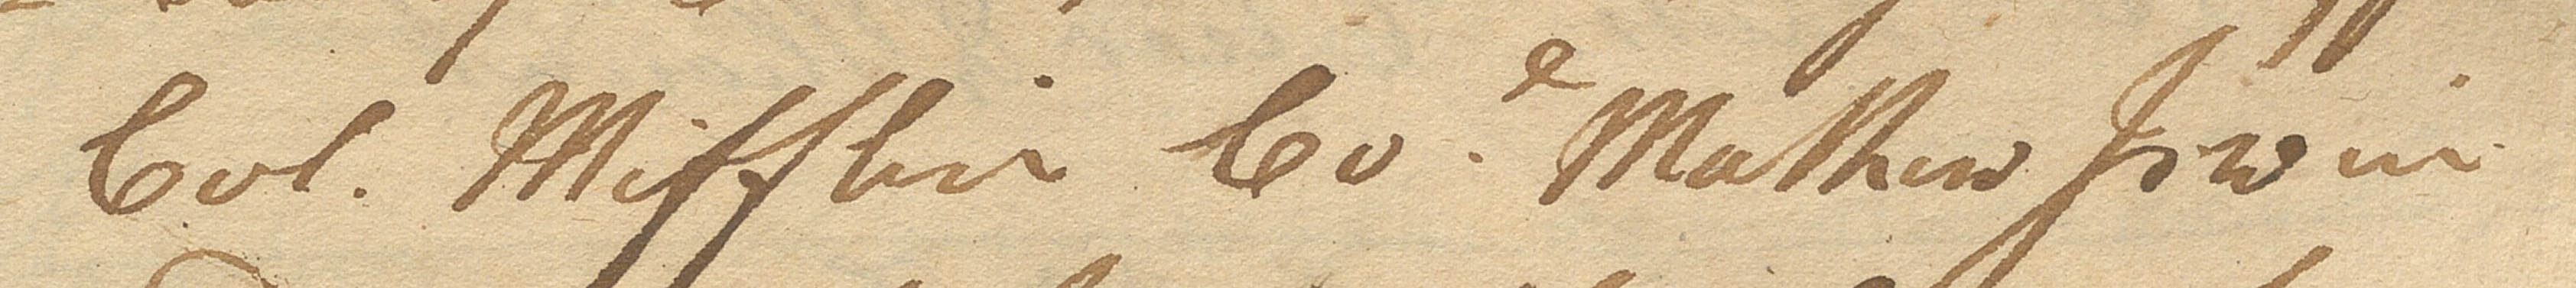Col. Mifflin Co^l. Mathew Irwin
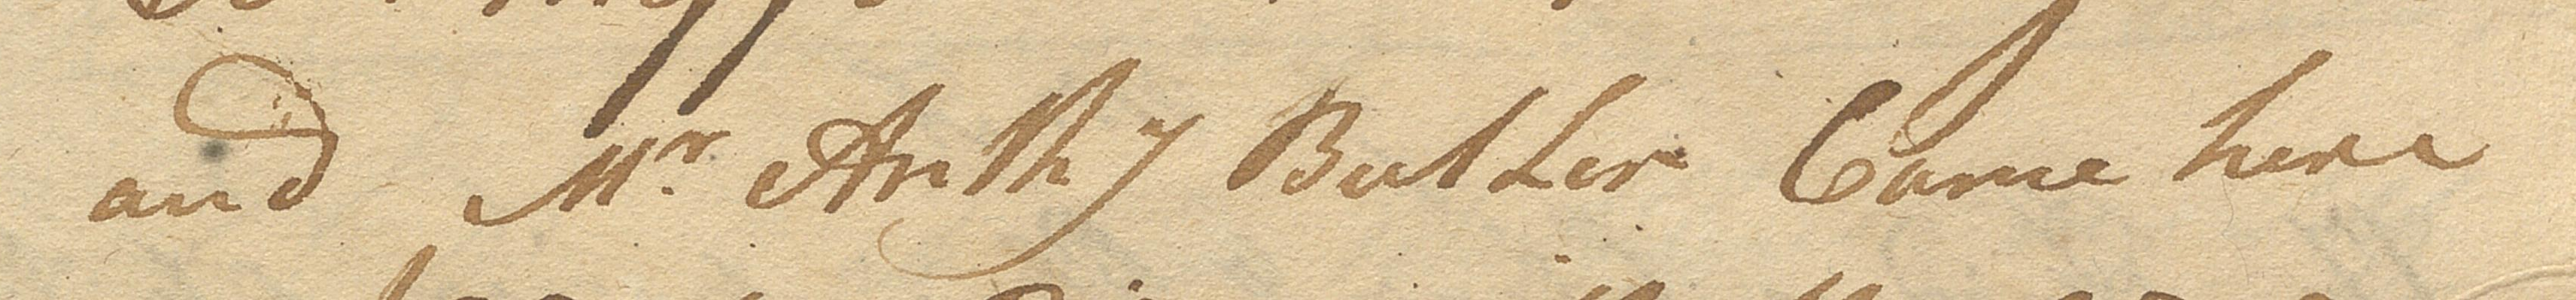and M^r. Anth^y Butler Came here
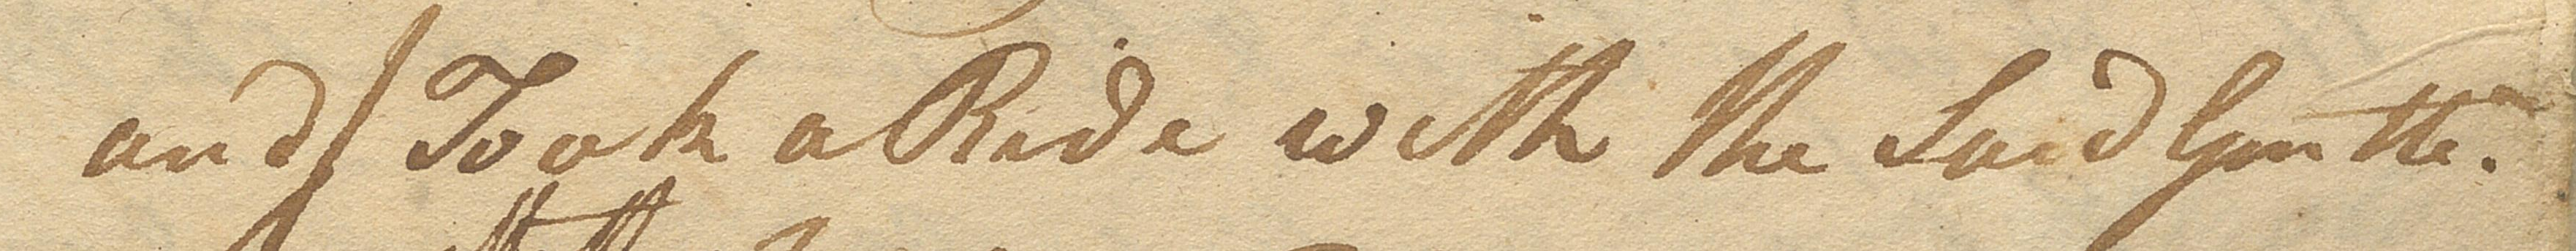and / Took a Ride with the Said Gentle^n.
